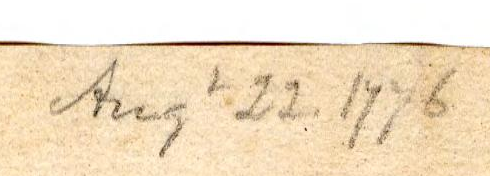Aug^t 22. 1776
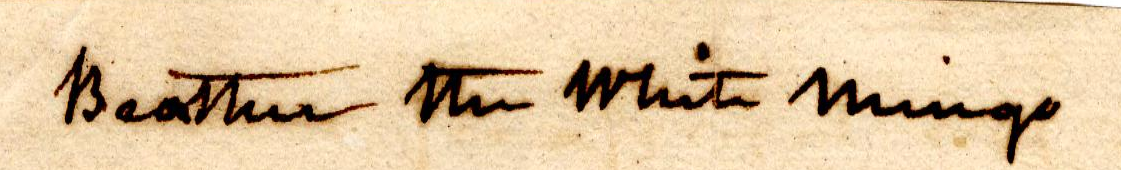Brother the White Mingo
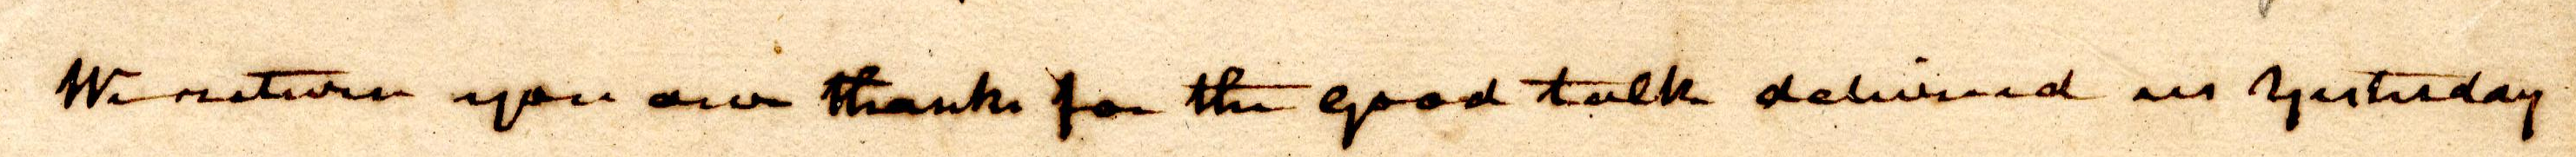We return you our thanks for the good talk delivered us yesterday
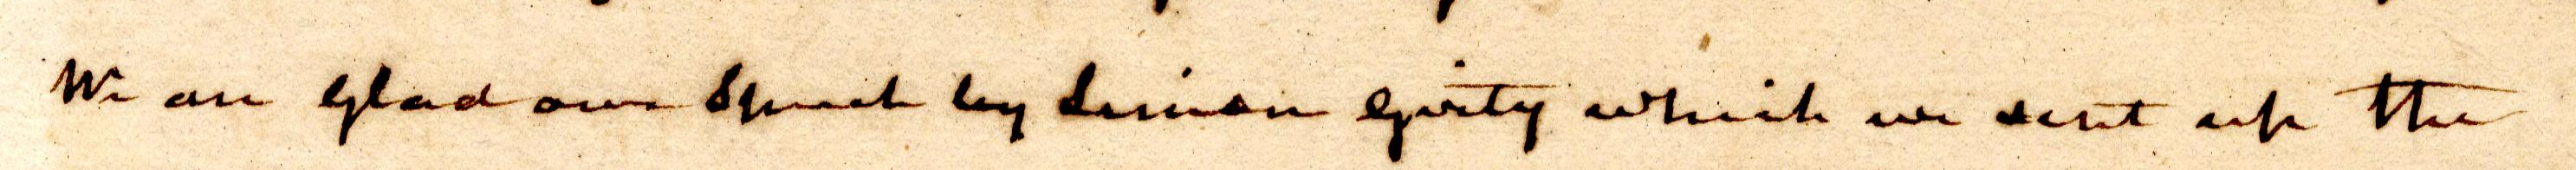We are glad our speech by Simon Girty which we sent up the
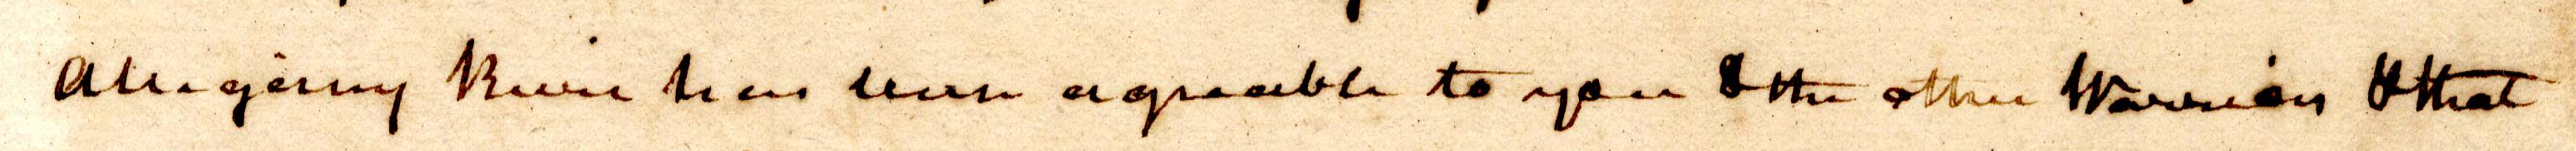Allageny River has been agreeable to you & the other Warriors & that
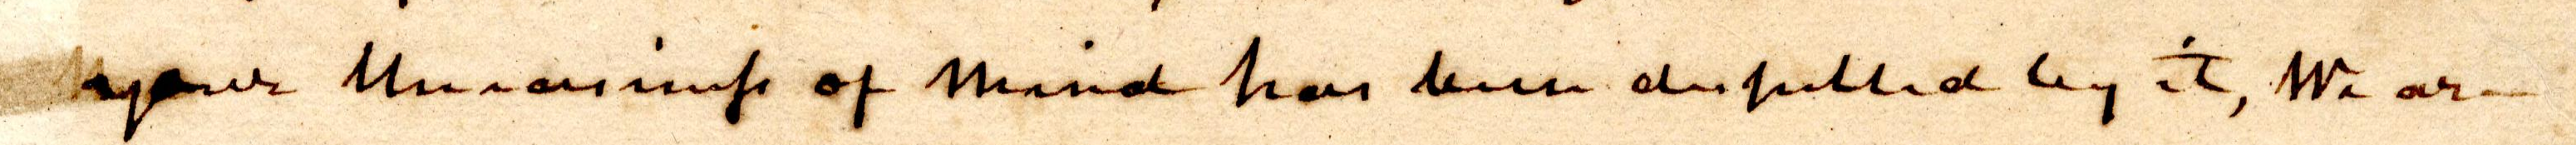your Uneasiness of mind has been dispelled by it, We are
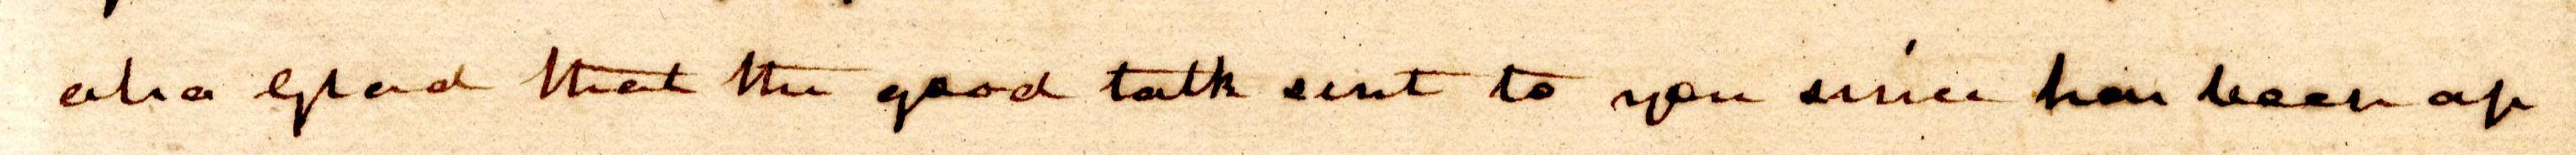also glad that the good talk sent to you since has been ap
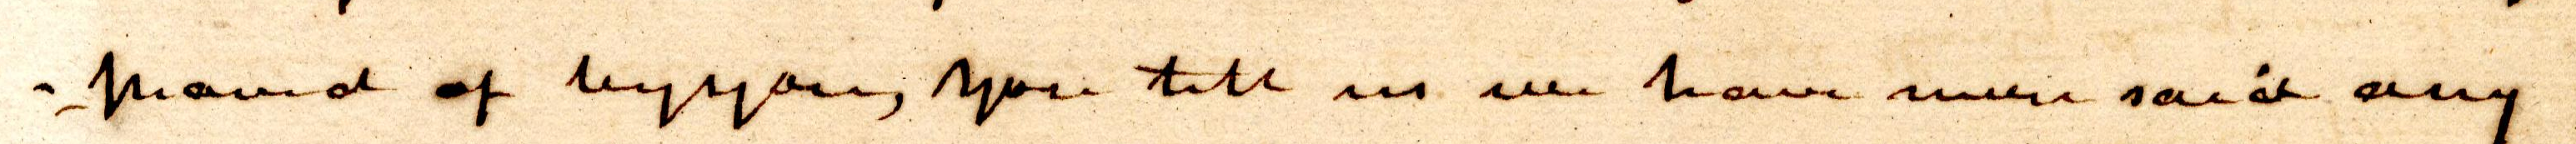-proved of by you, you tell us we have never said any
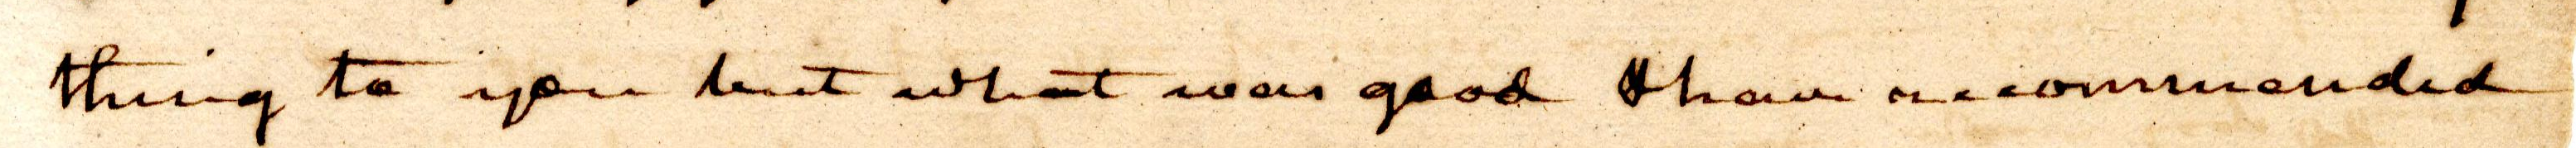thing to you but what was good & have recommended
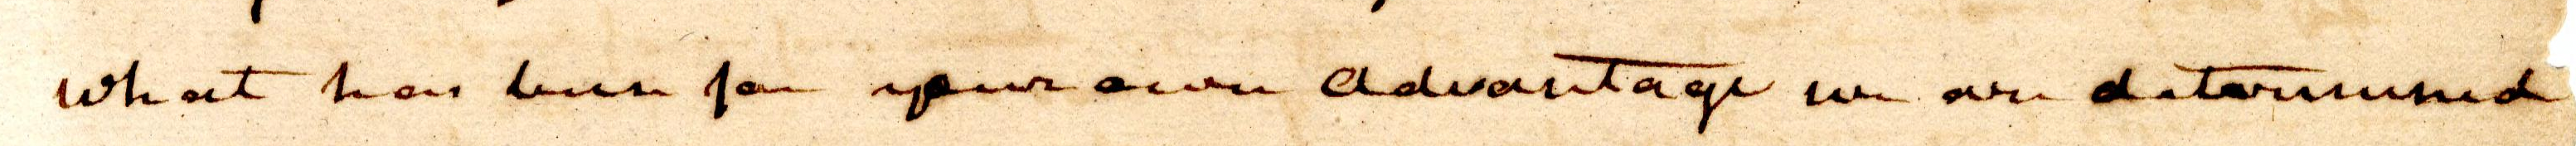what has been for your own Advantage we are determined
